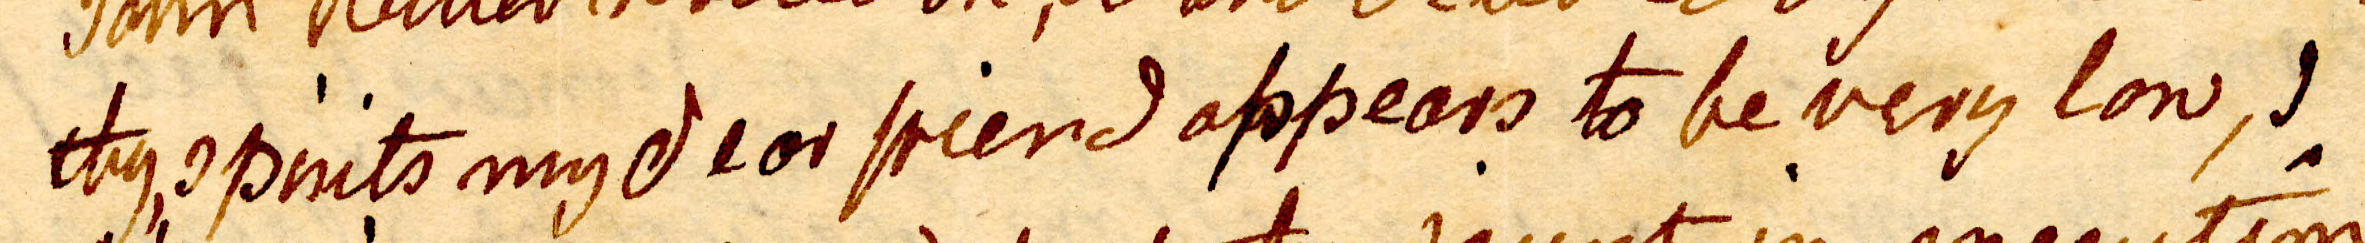thy spirits my dear friend appears to be very low, I
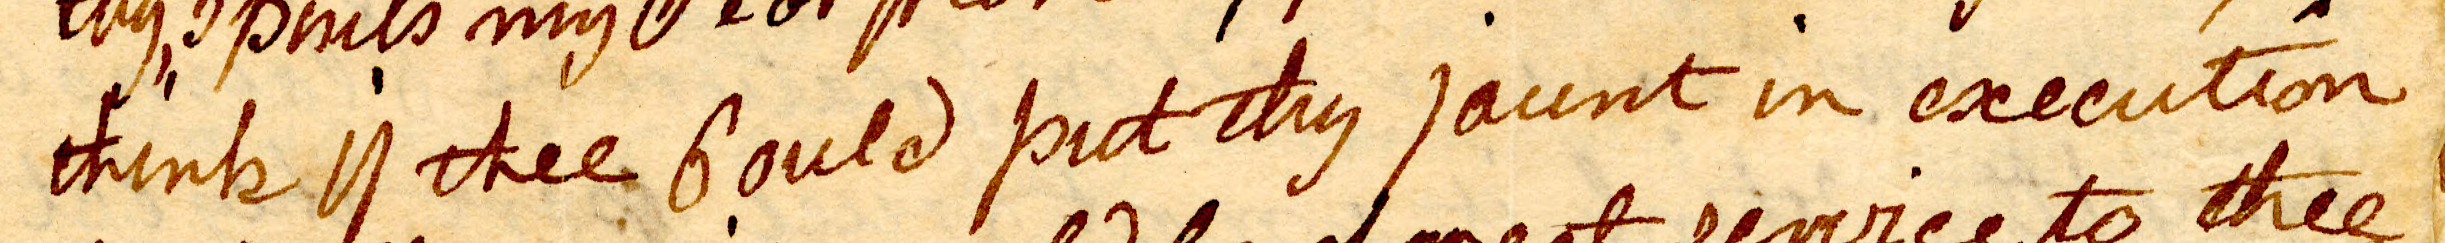think if thee could put they jaunt in execution
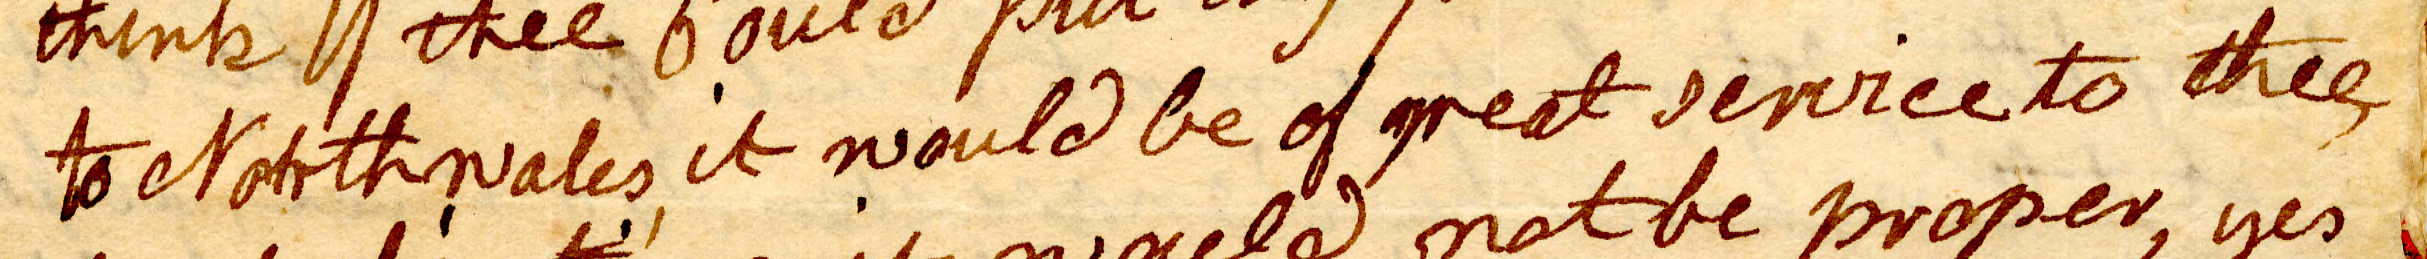to Northwales it would be of great service to thee,
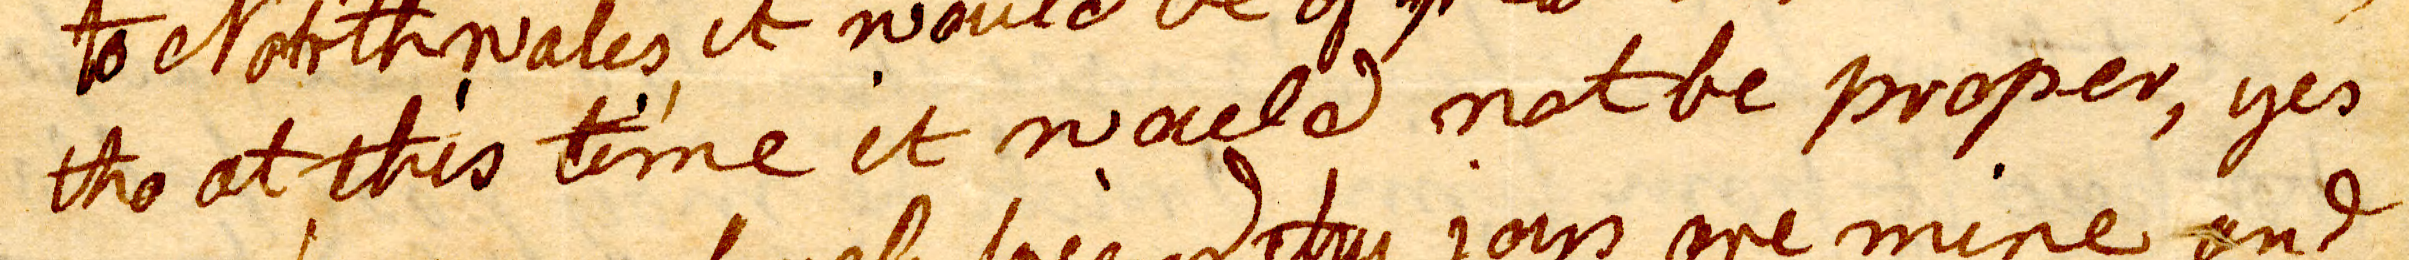tho at this time it would not be proper, yes
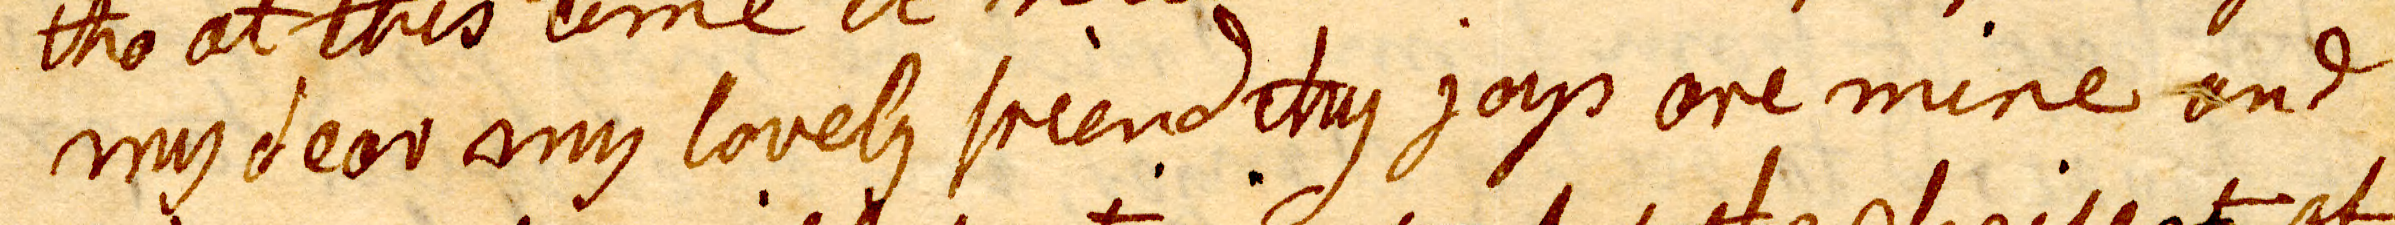my dear my lovely friend thy joys are mine and
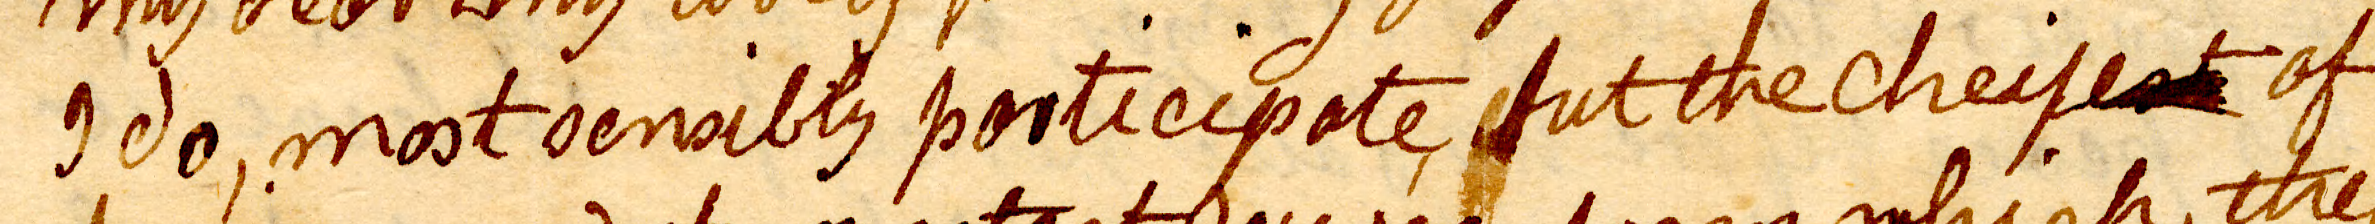I do, most sensibly participate, but the cheifest of
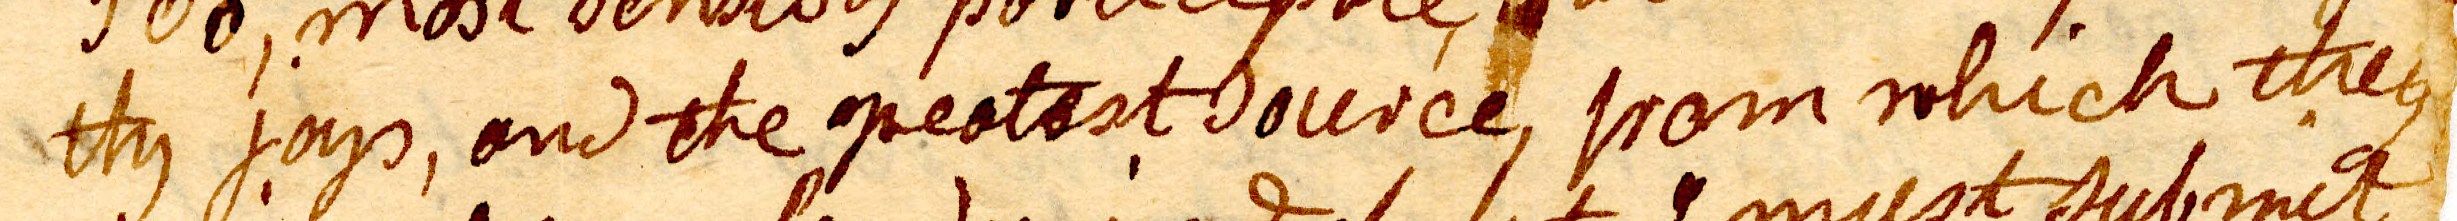thy joys, and the greatest source from which they
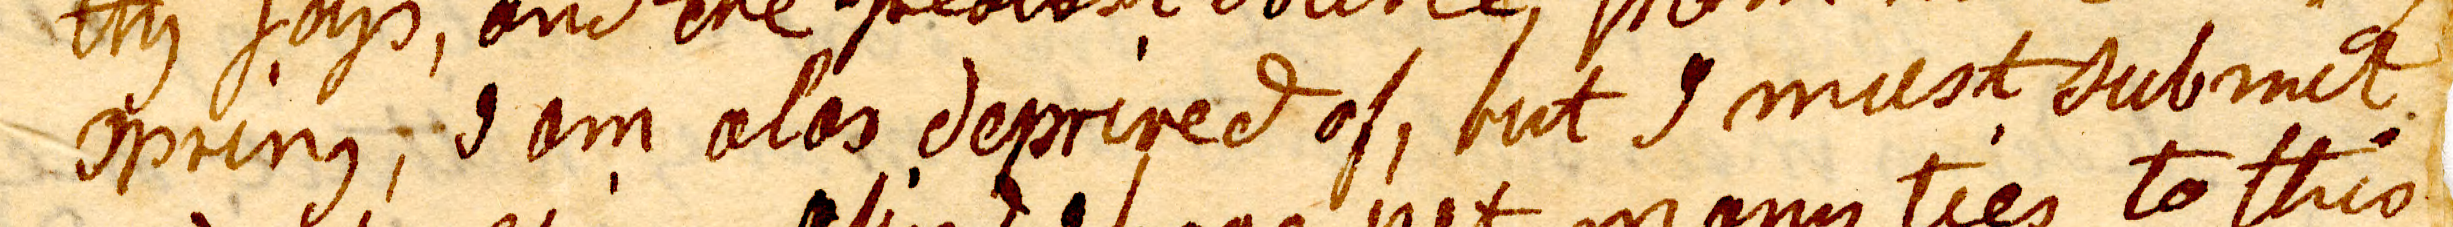spring, I am alas deprived of, but I must submit
